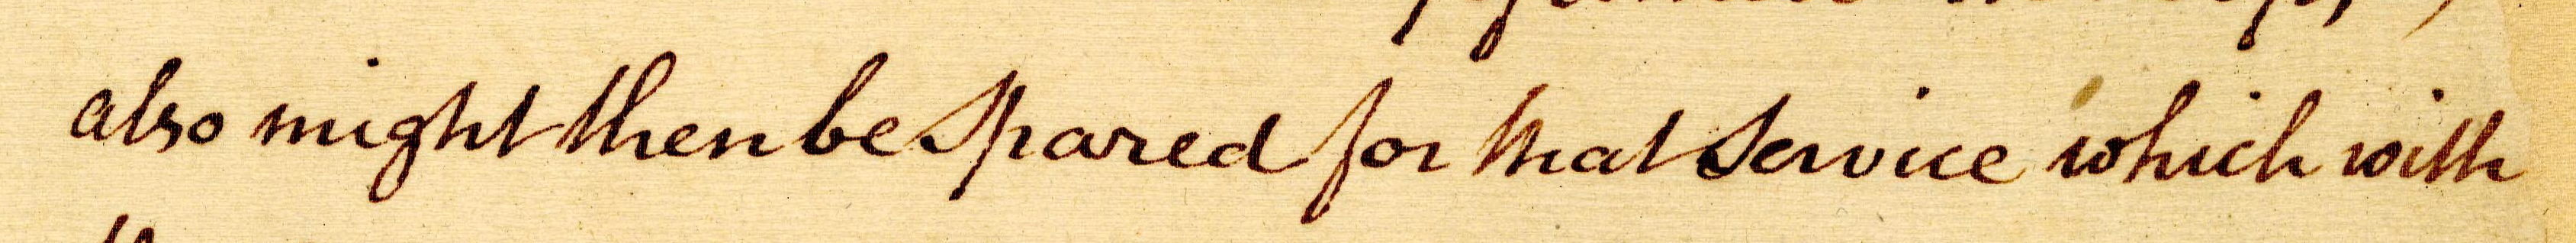also might then be spared for that Service which with
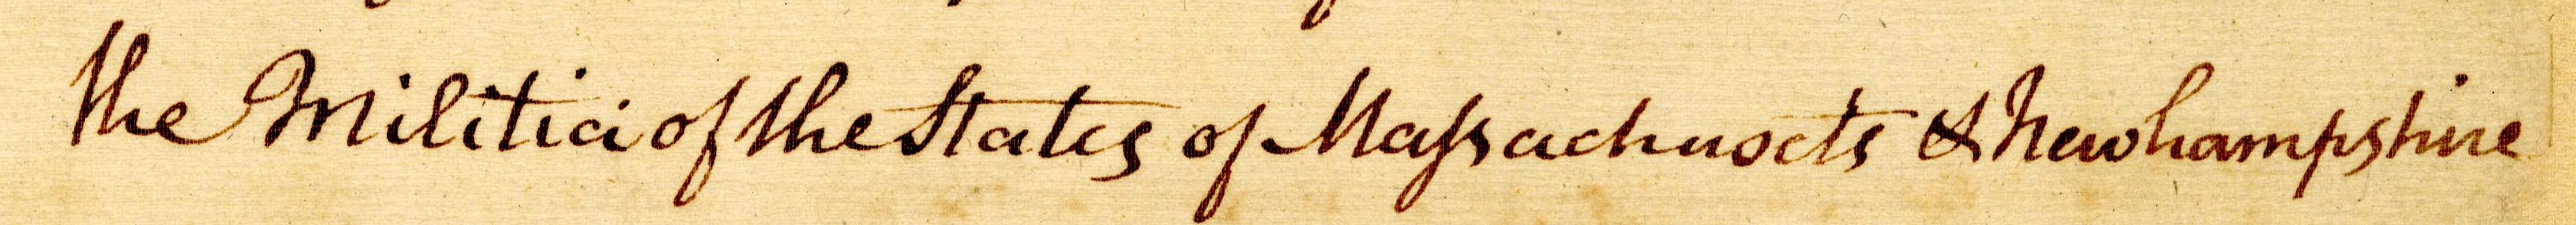the Militia of the States of Massachusets & New hampshire
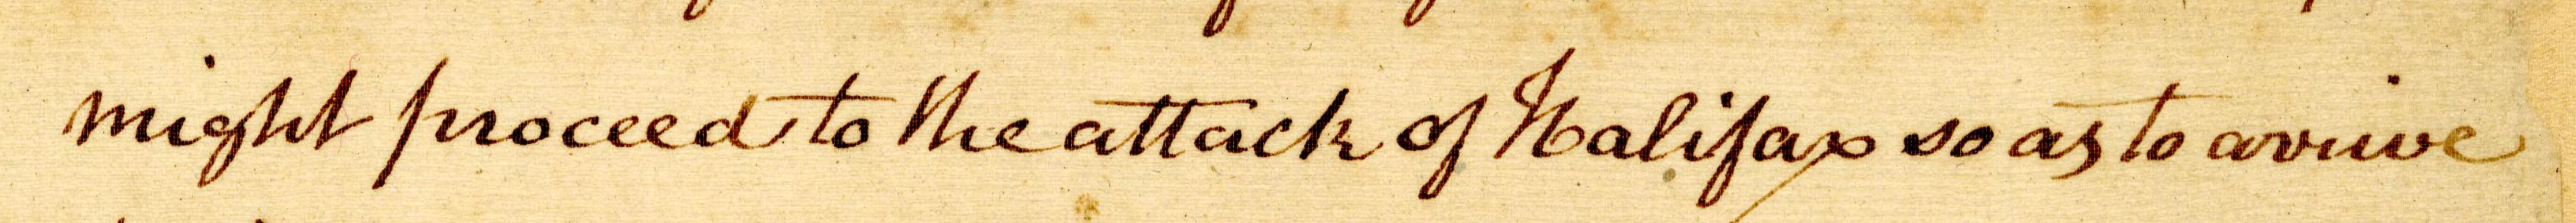might proceed to the attack of Halifax so as to arrive
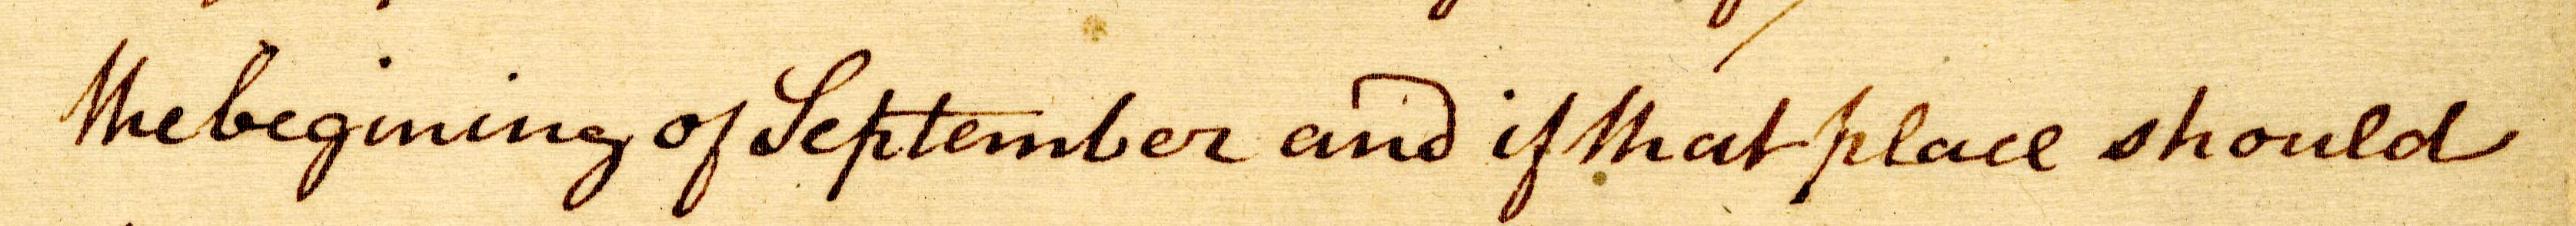the begining of September and if that place should
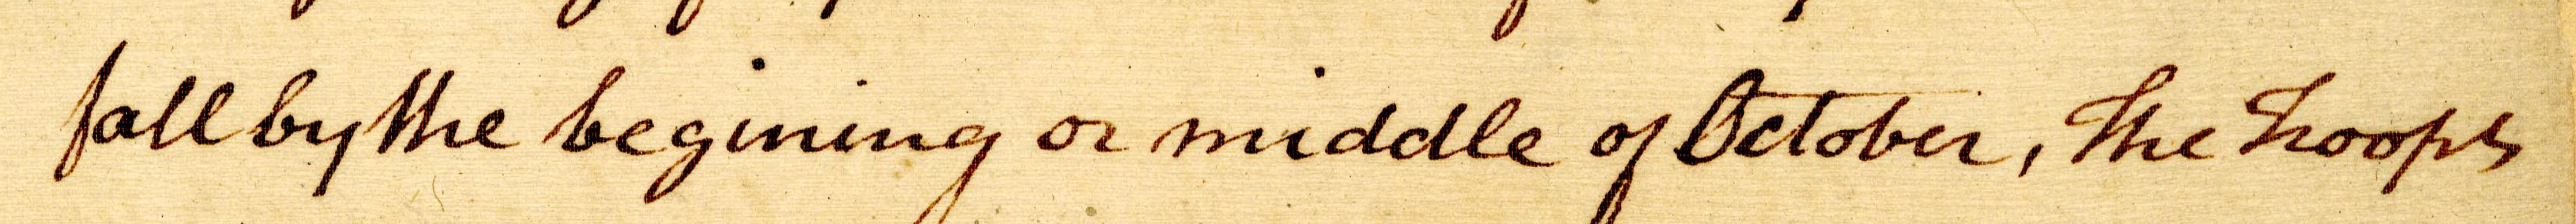fall by the begining or middle of October, The Troops
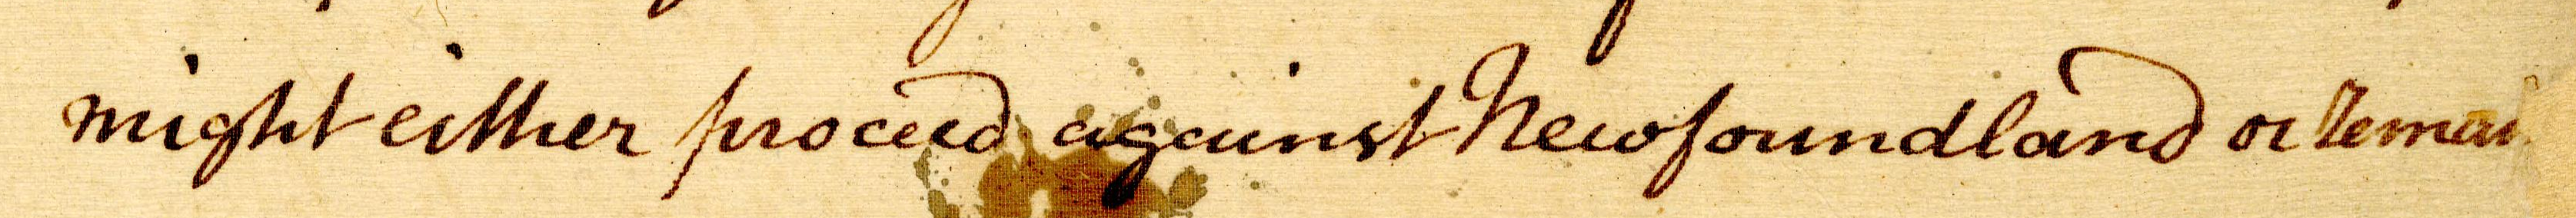might either proceed against Newfoundland or remain
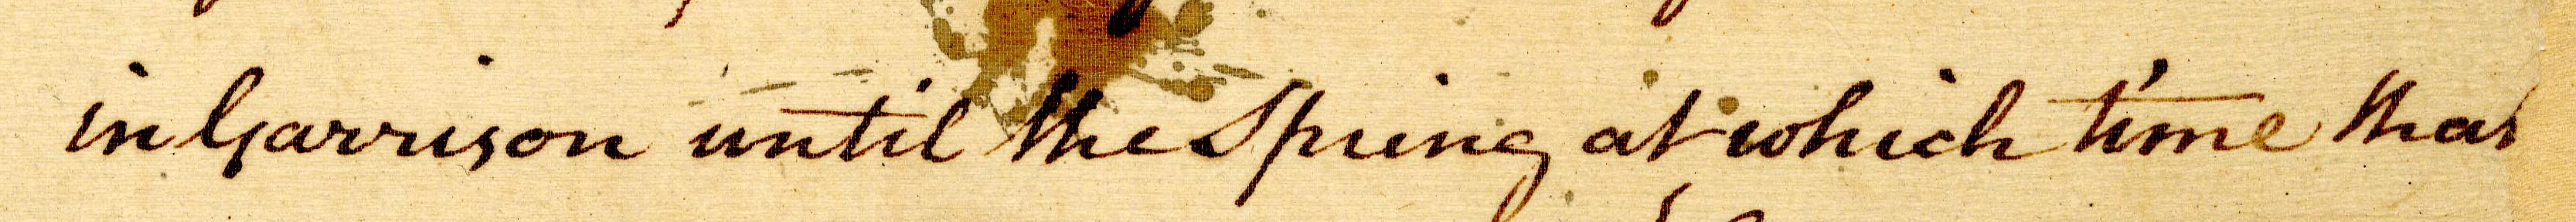in Garrison until the Spring at which time that
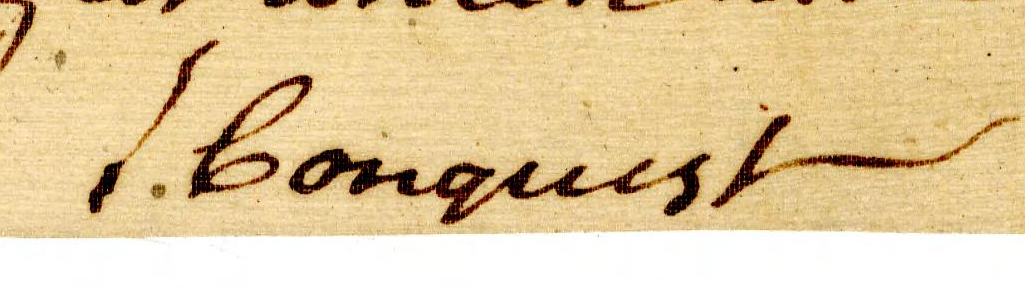Conquest
